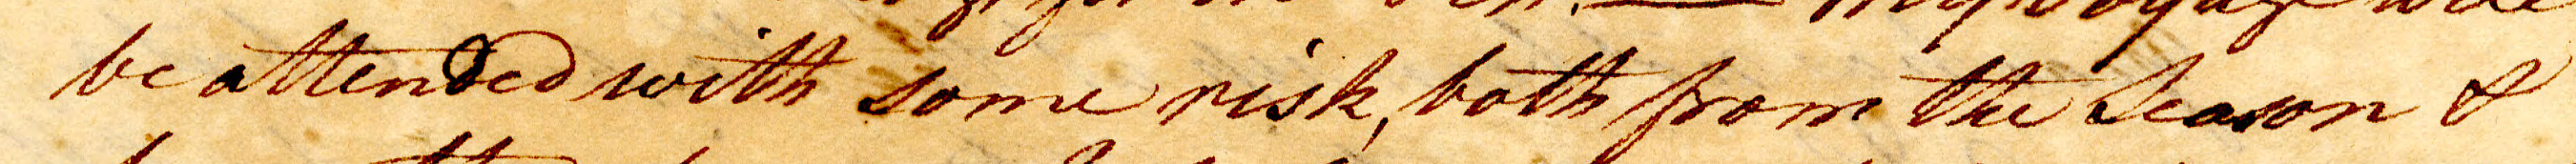be attended with some risk, both from the Season &
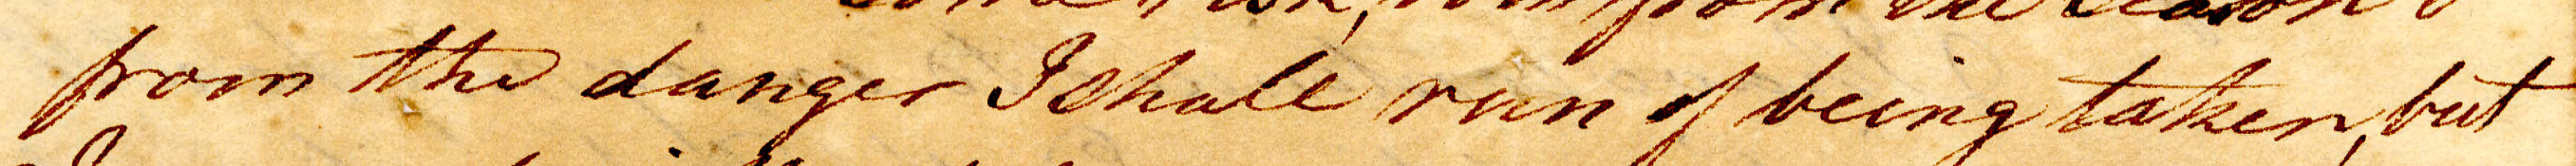from the danger I shall run of being taken, but
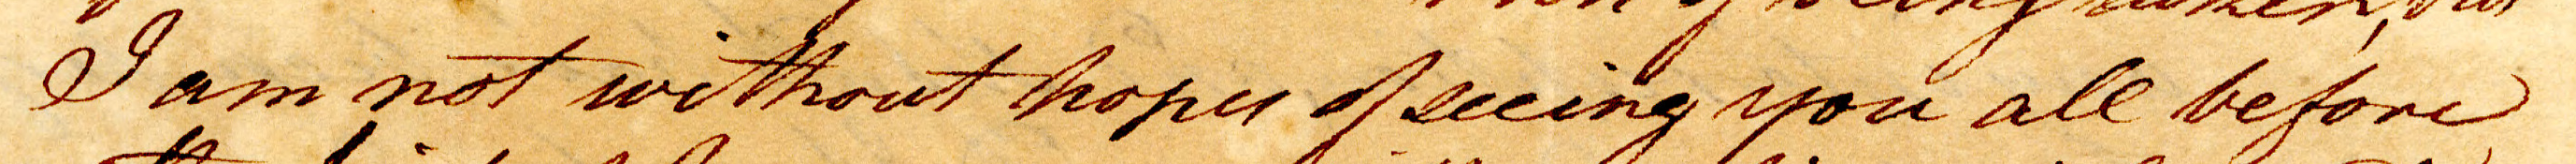I am not without hopes of seeing you all before
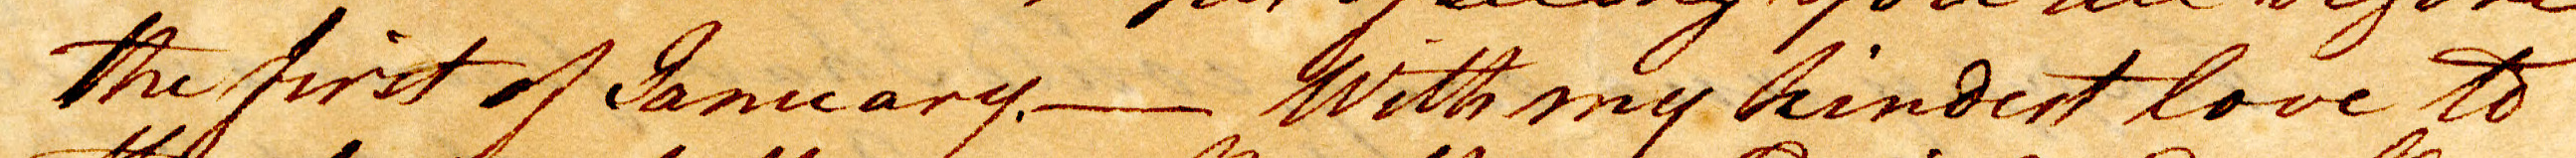the first of January.- With my kindest love to
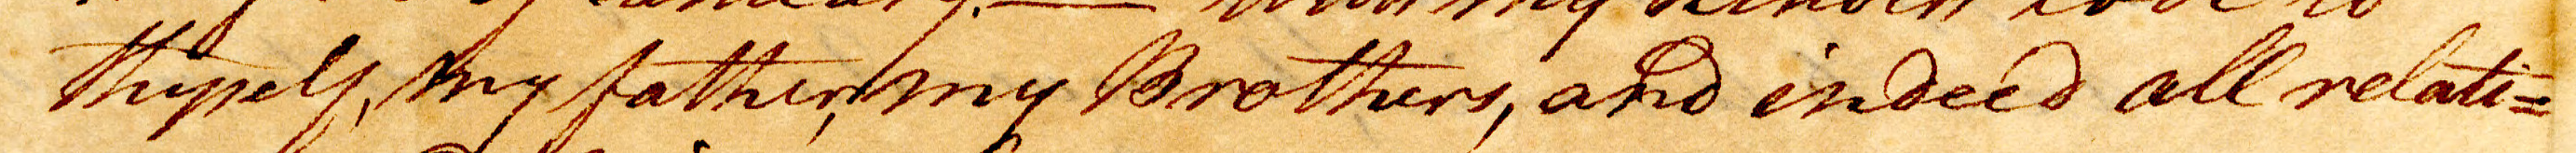thyself, my father, my Brothers, and indeed all relati-
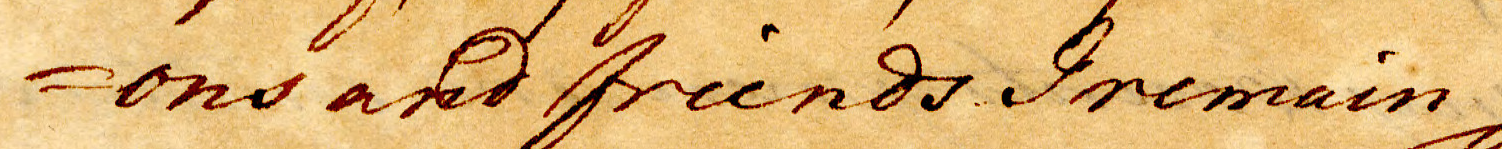-ons and friends I remain
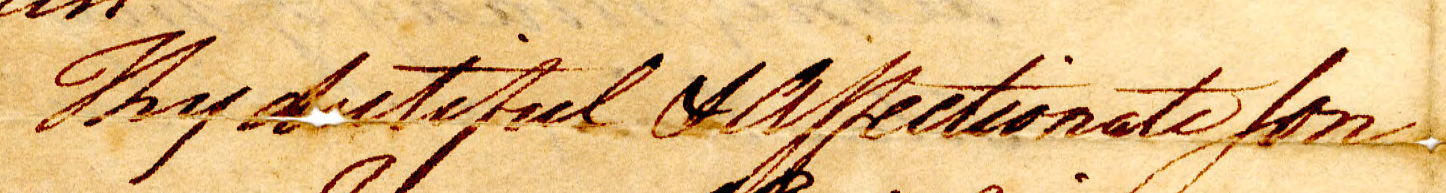Thy dutiful & Affectionate Son
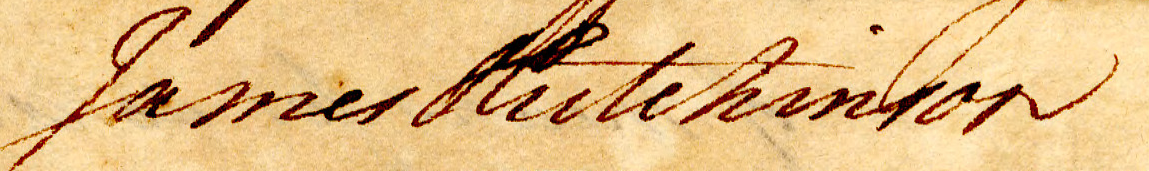James Hutchinson
